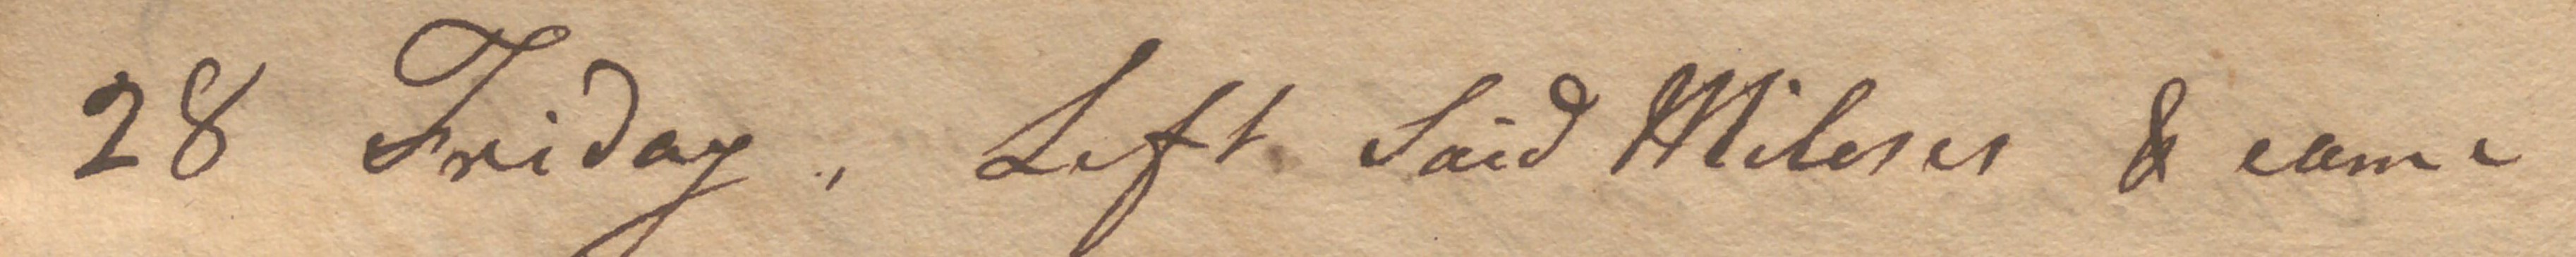28 Friday, Left Said Mileses & came
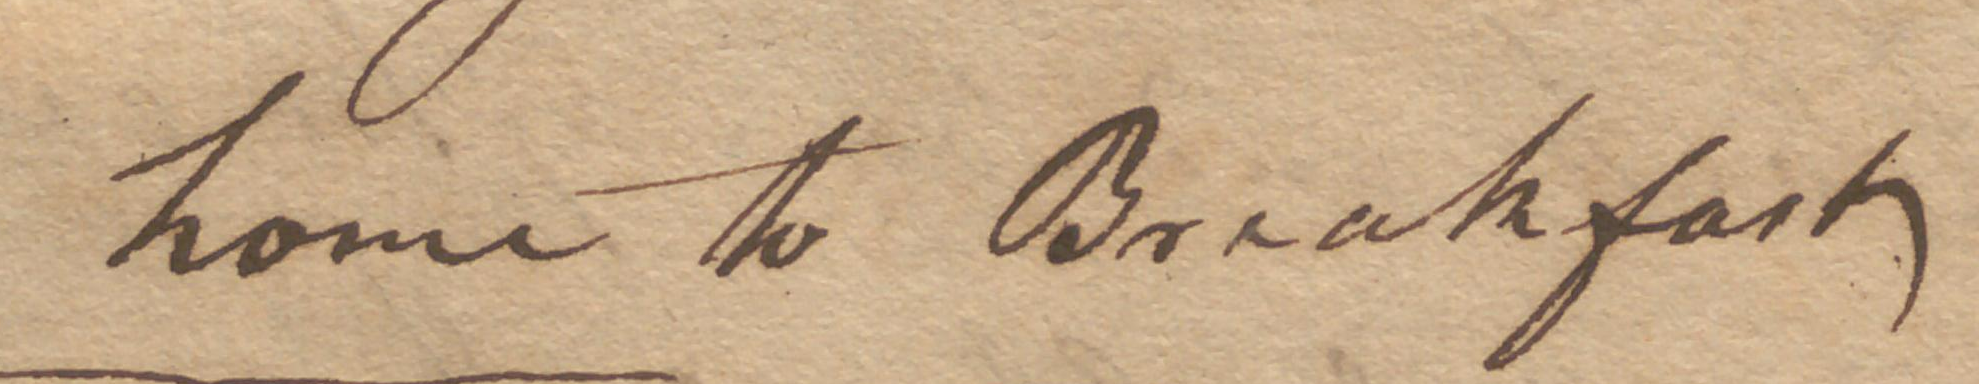home to Breakfast
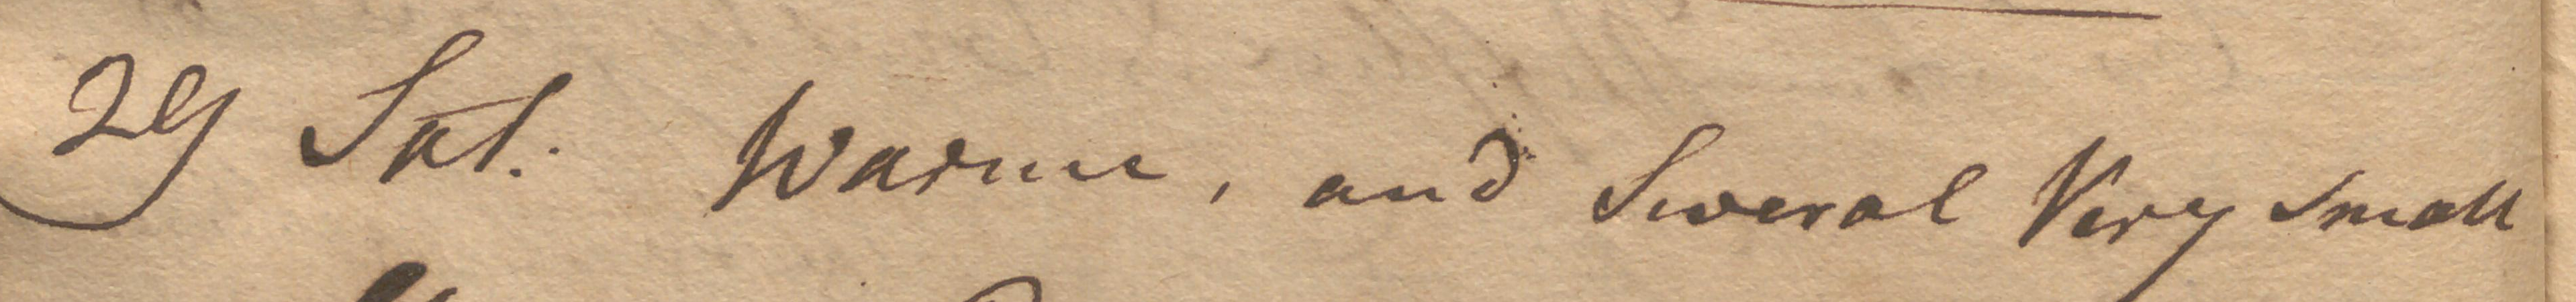29 Sat: warme, and Several Very small
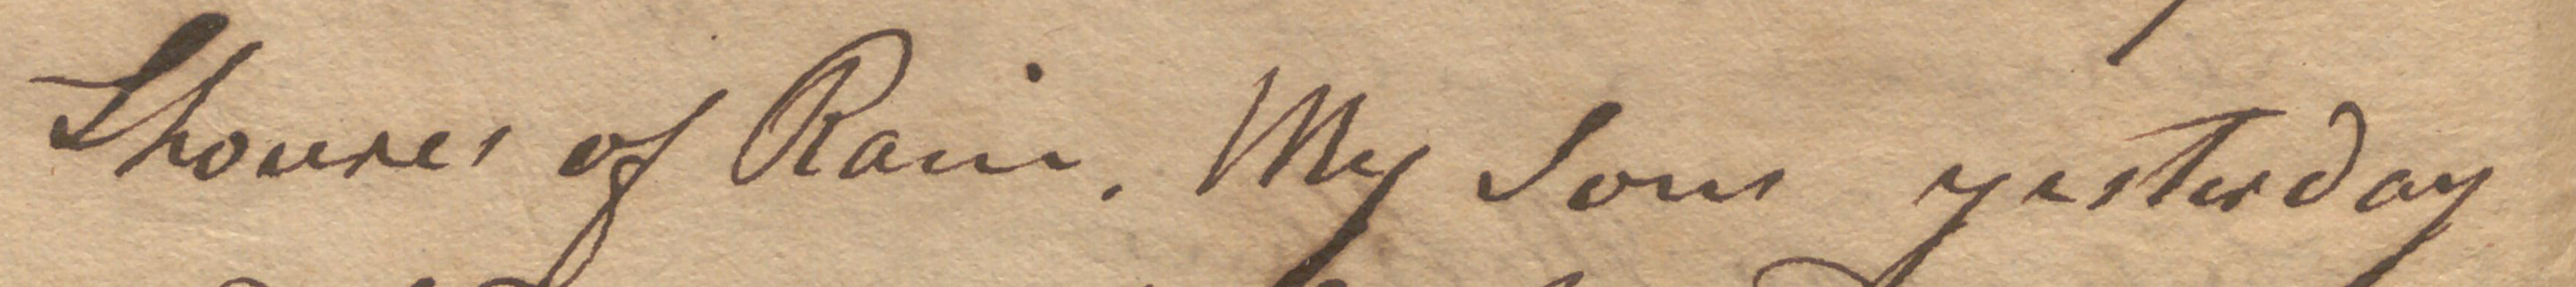Shoures of Rain. My Sons yesterday
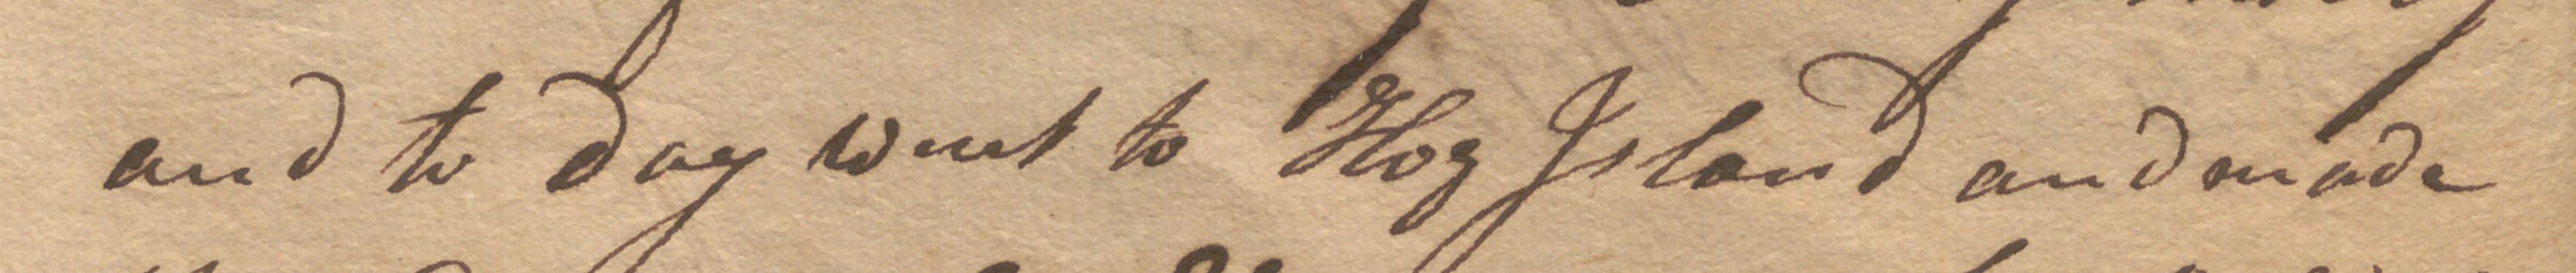and to day went to Hog Island and made
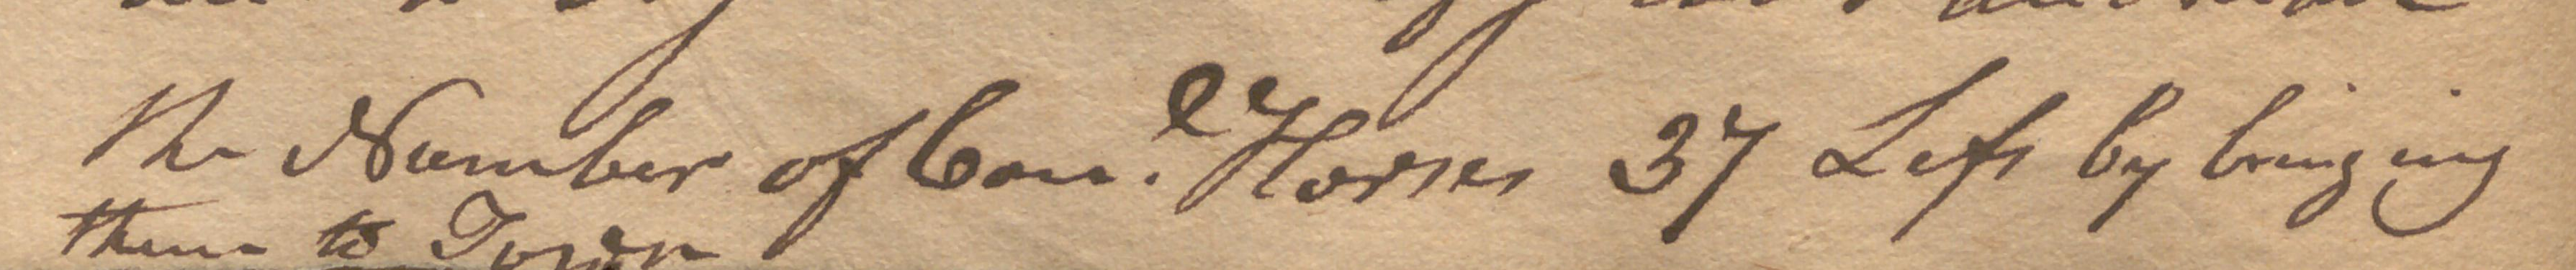the Number of Con^l. Horses 37 Less by bringing
